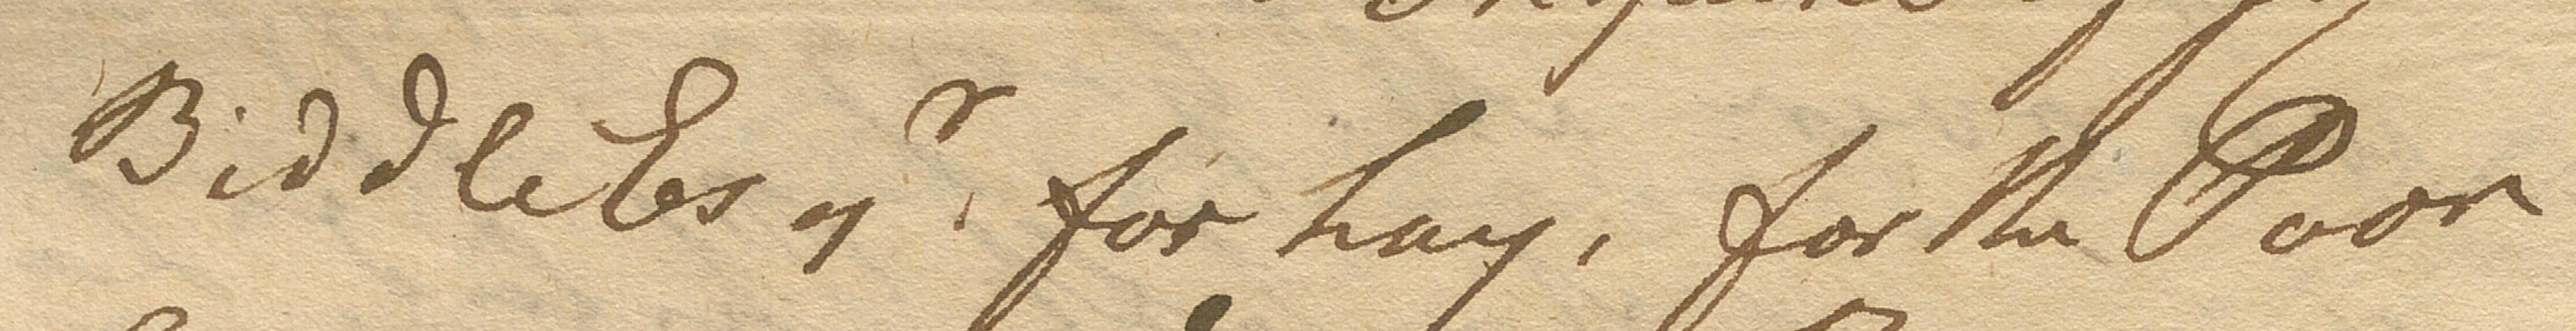Biddle Esq^r. for hay, for the Poor
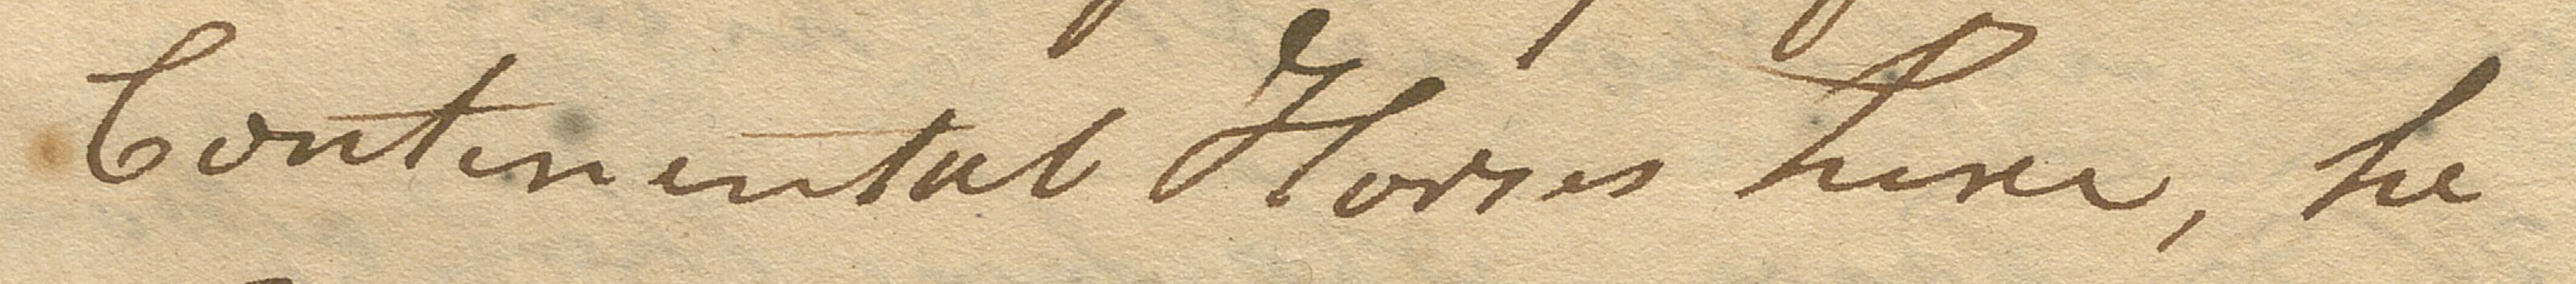Continental Horses here, he
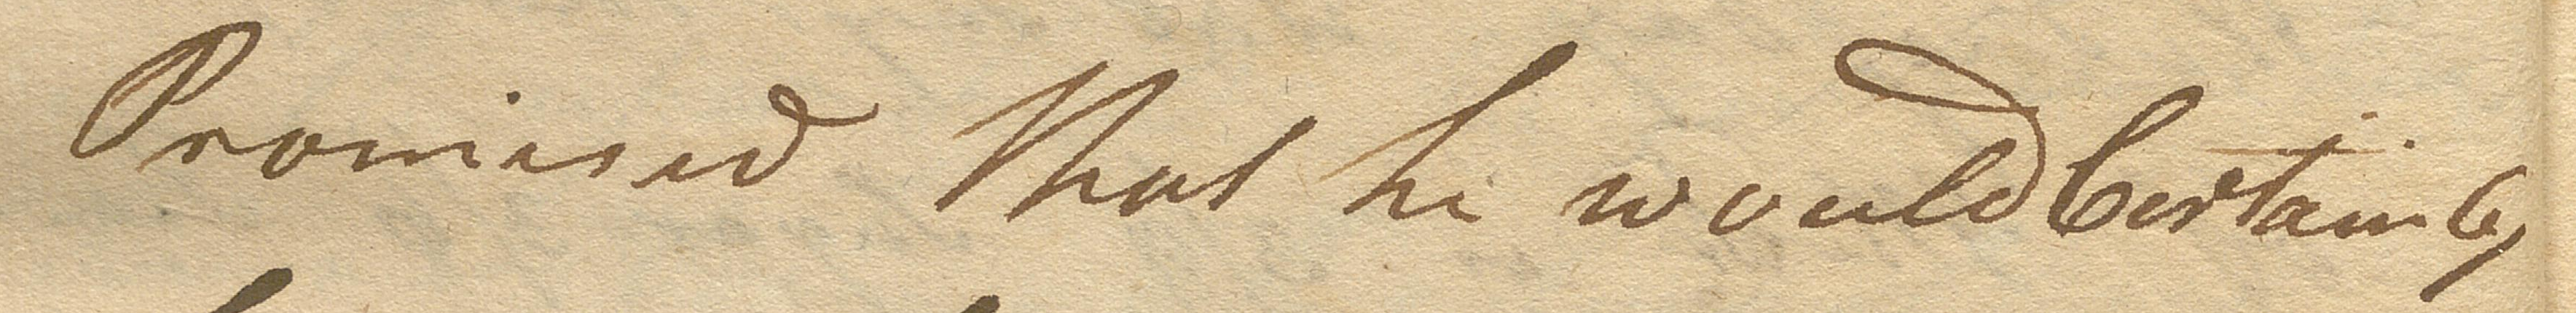Promised that he would Certainly
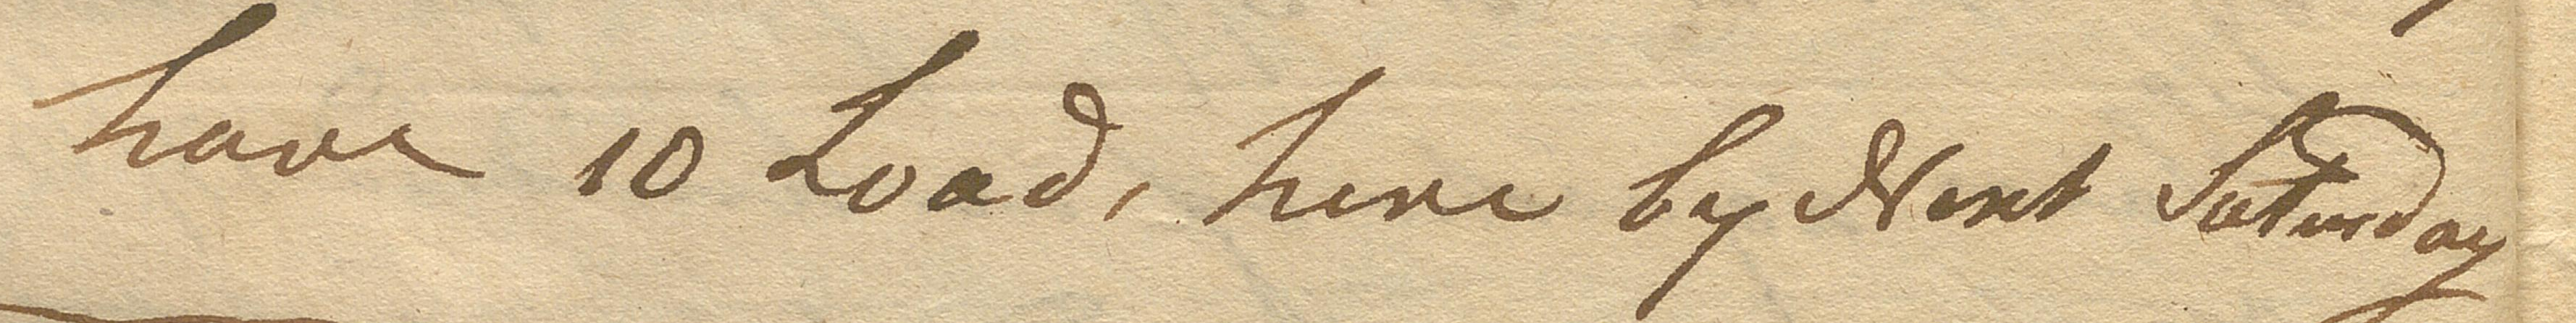have 10 Load, here by Next Saturday
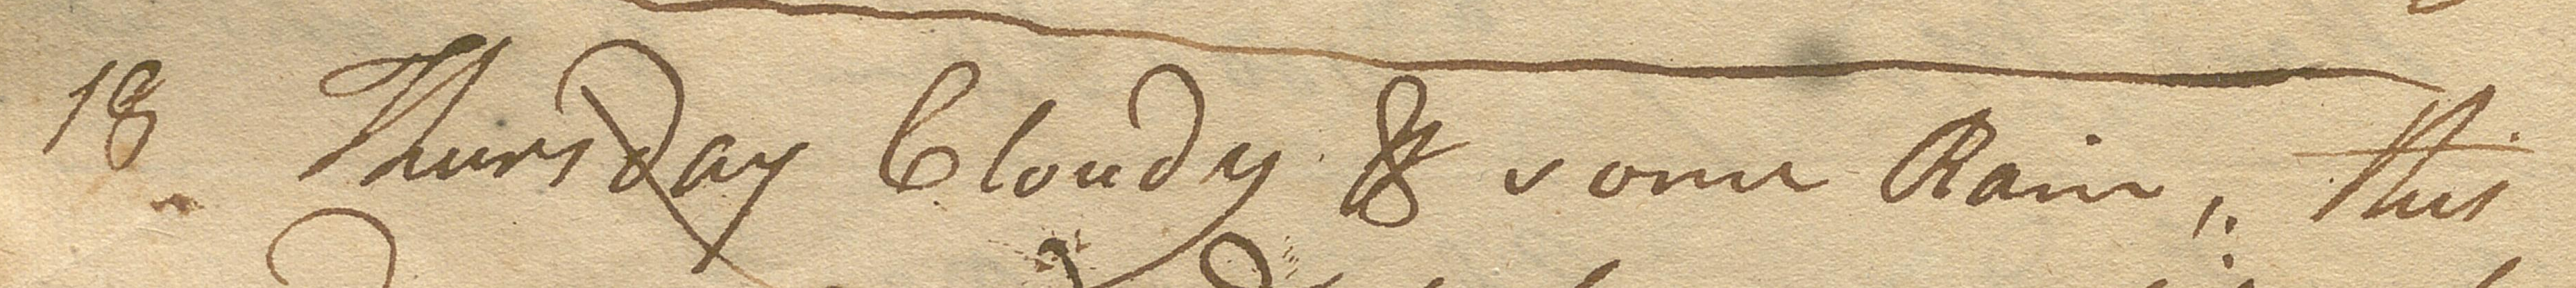18 Thursday Cloudy & some Rain, this
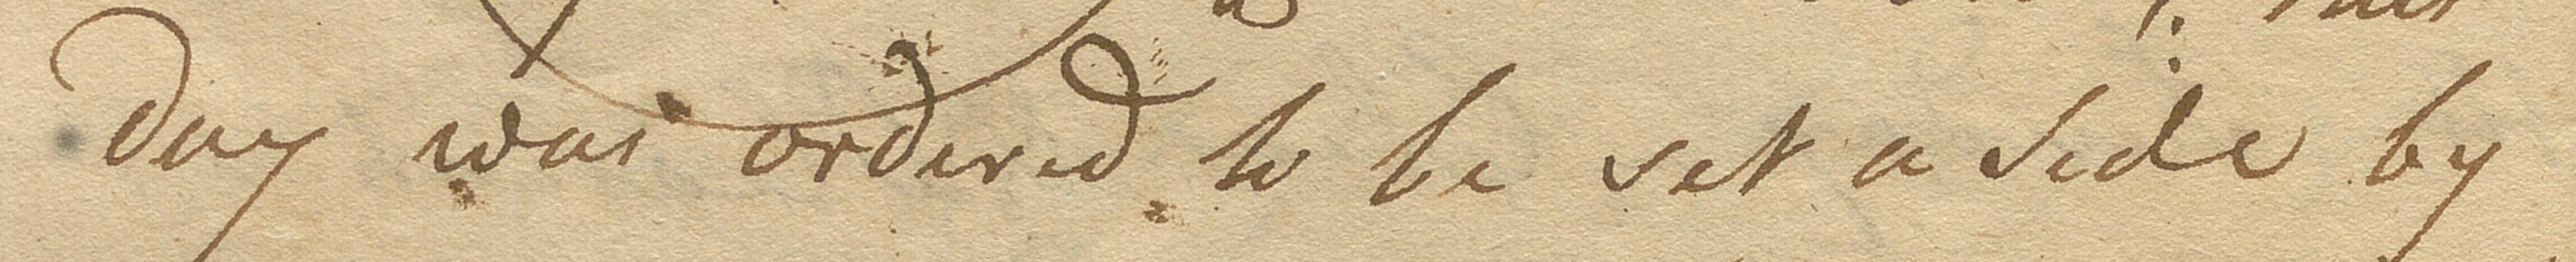day was ordered to be set a side by
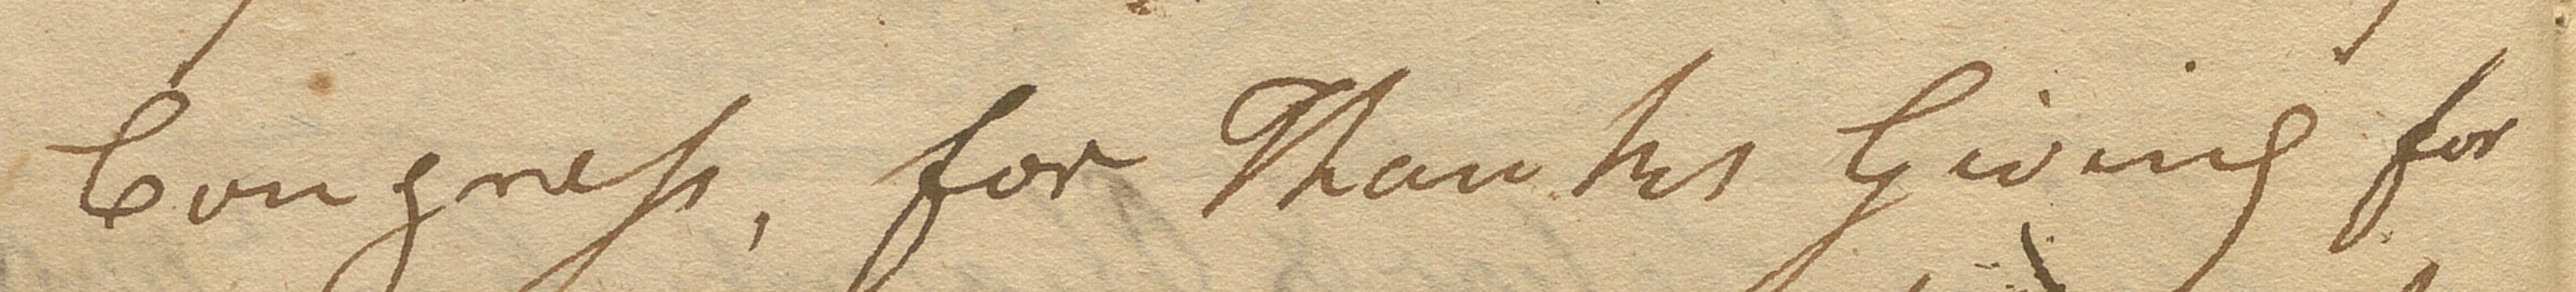Congress for Thanks Giving for
